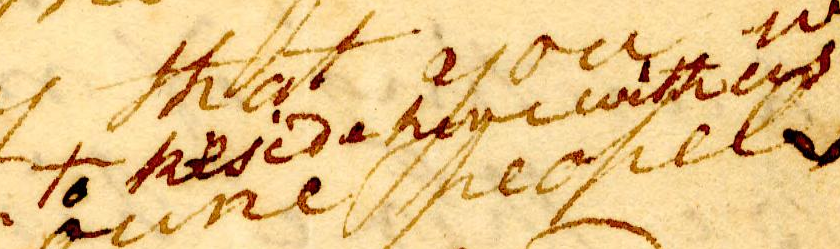to reside here with us
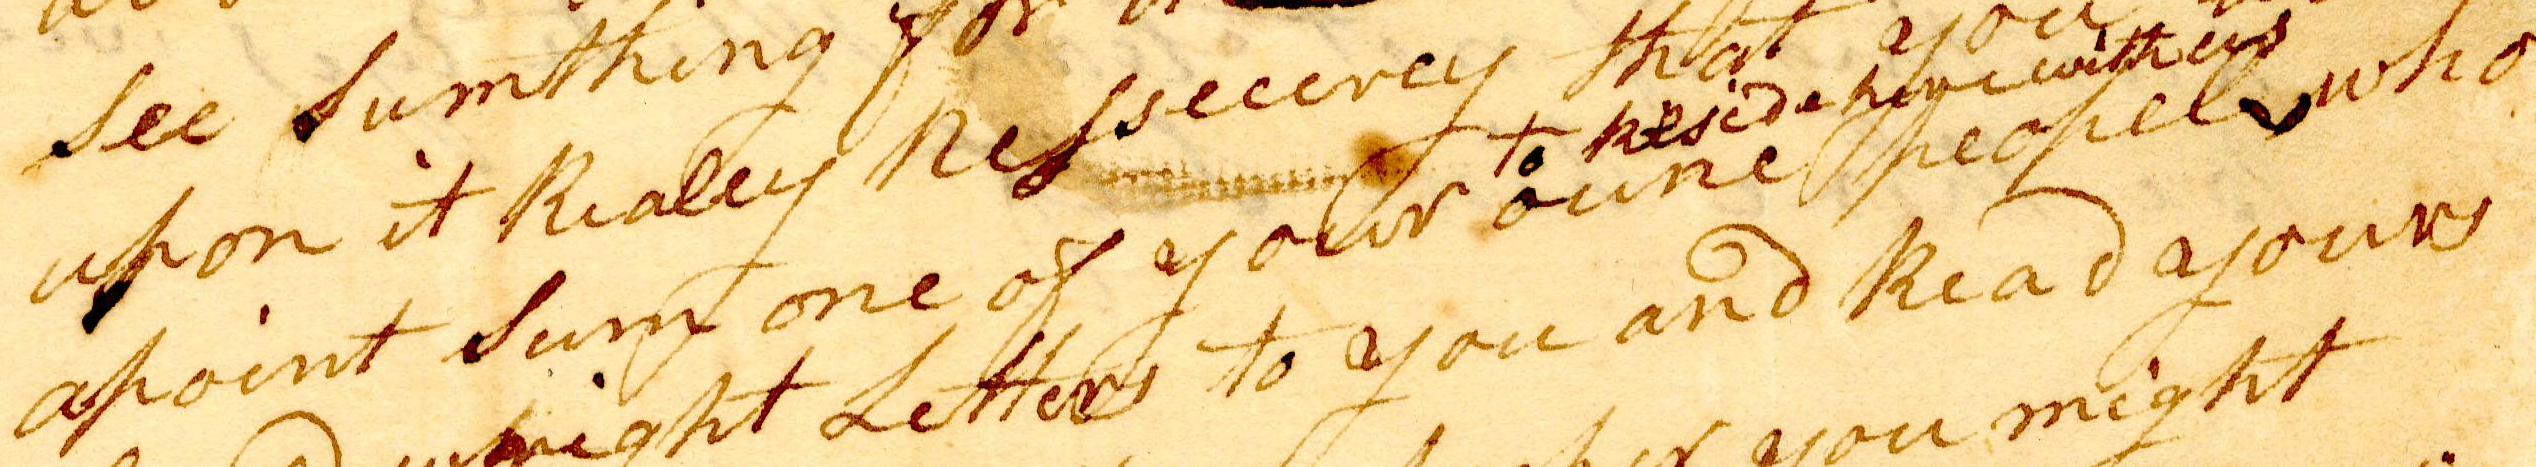apoint Sum one of your oune peopel ^ who
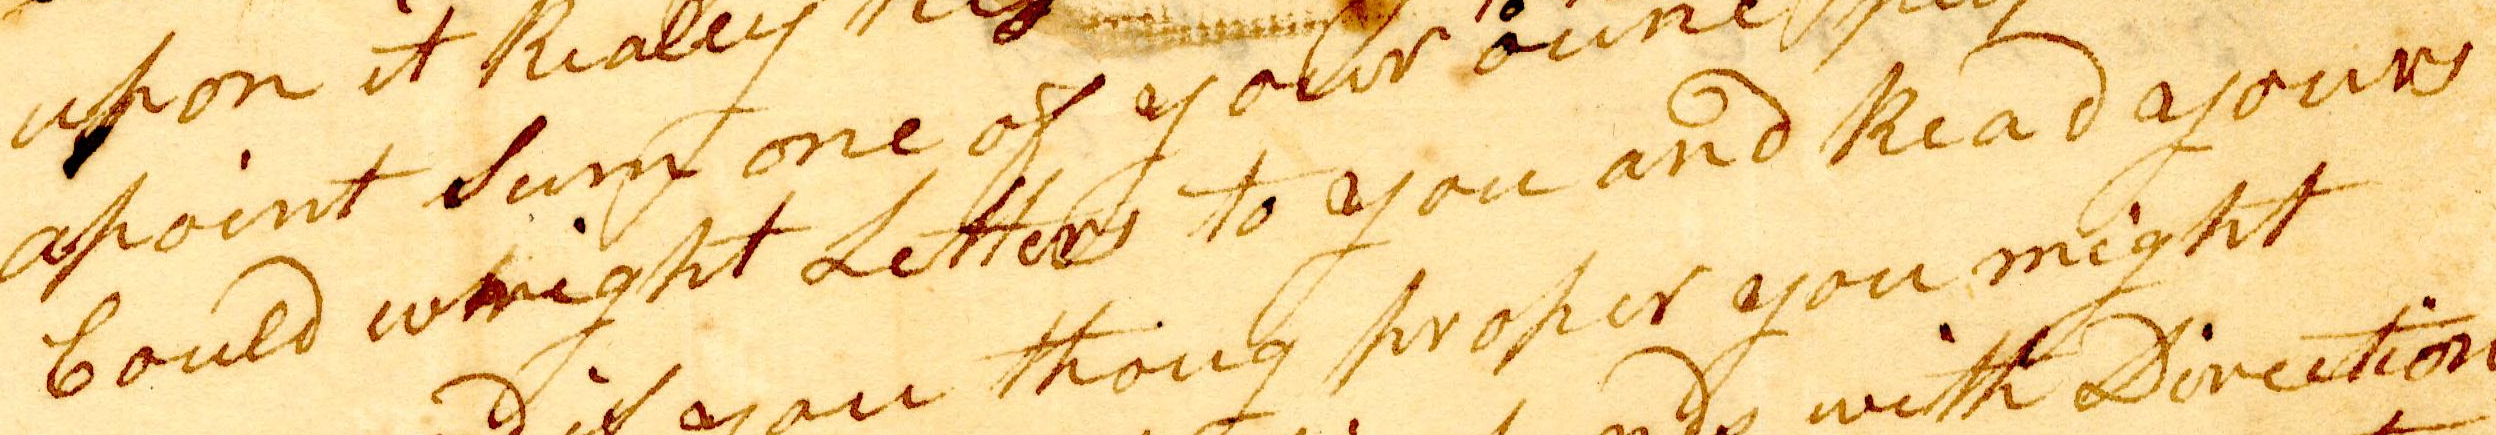Could wright Letters to you and Read yours
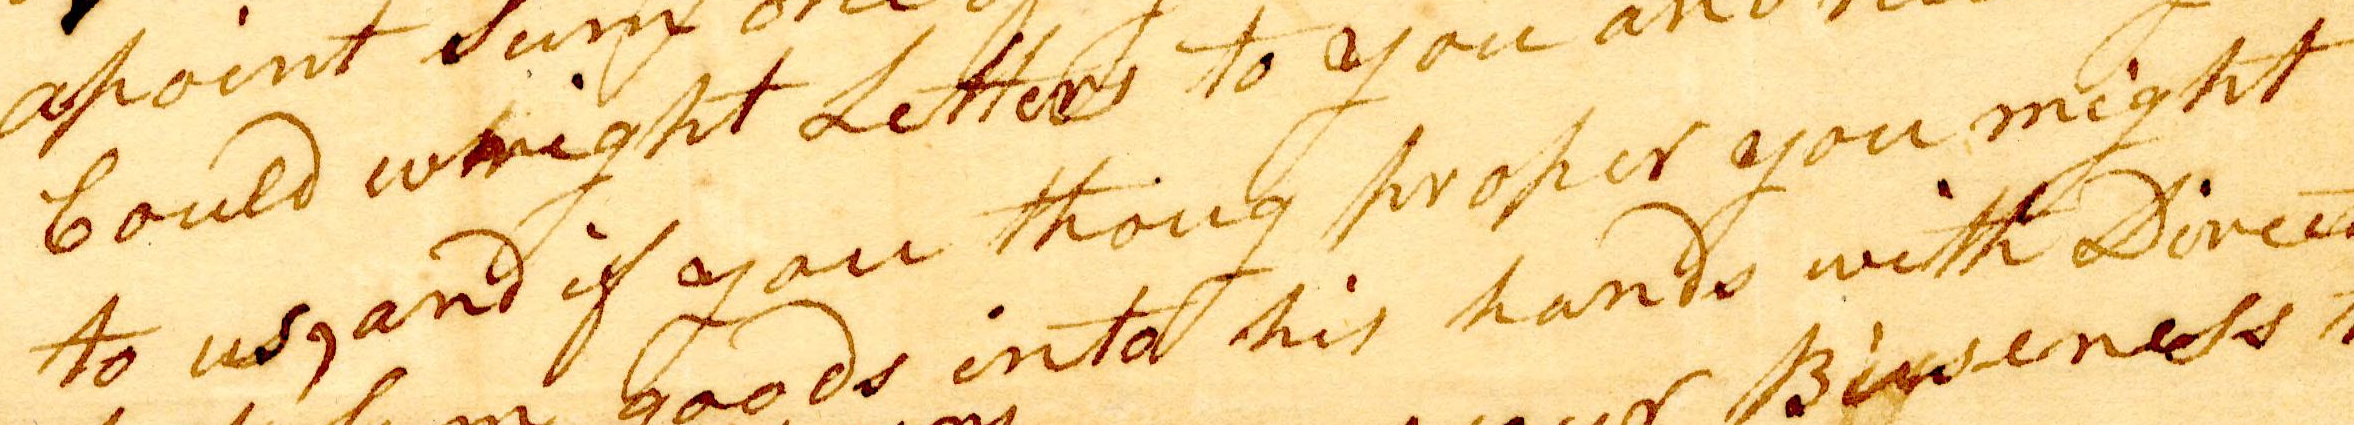to us, and if you thoug proper you might
